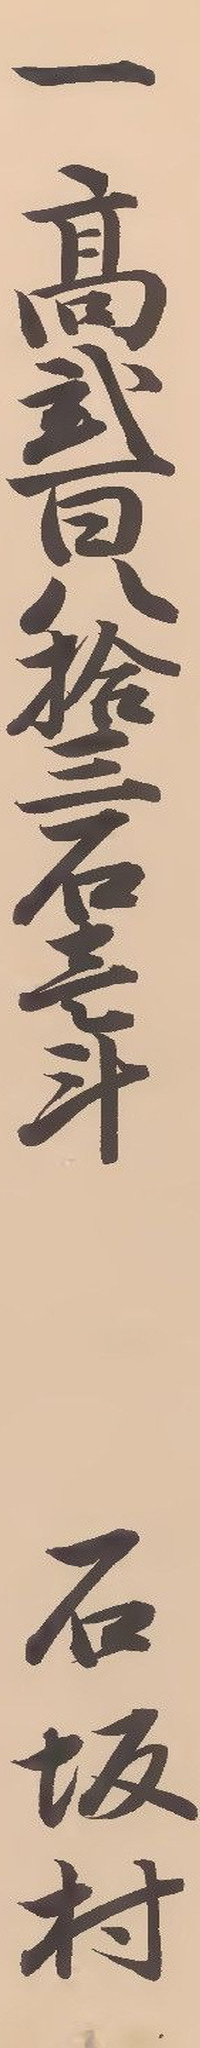一高弐百八拾三石壱斗石坂村
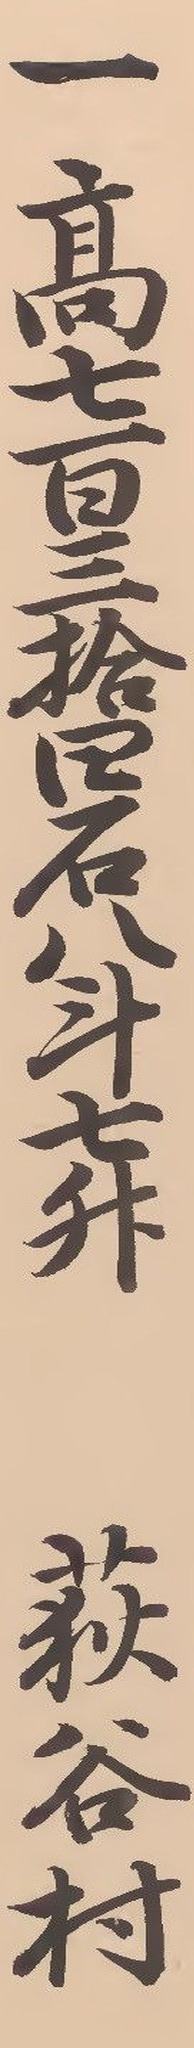一高七百三拾四石八斗七升荻谷村

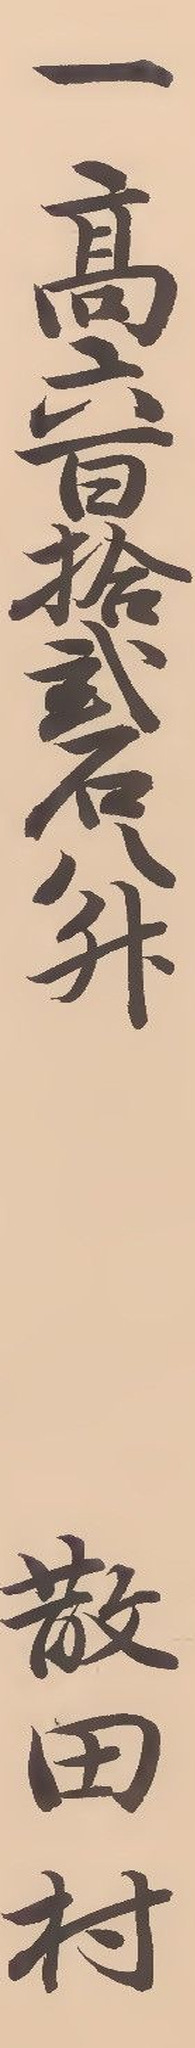一高六百拾弐石八升散田村
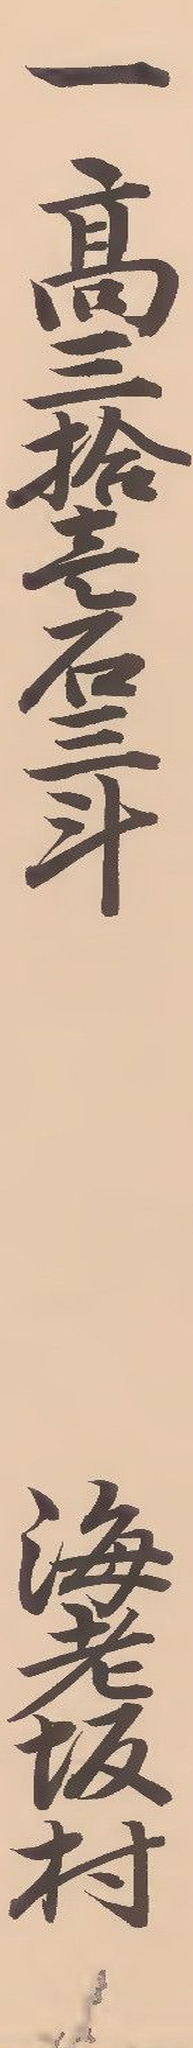一高三拾壱石三斗海老坂村
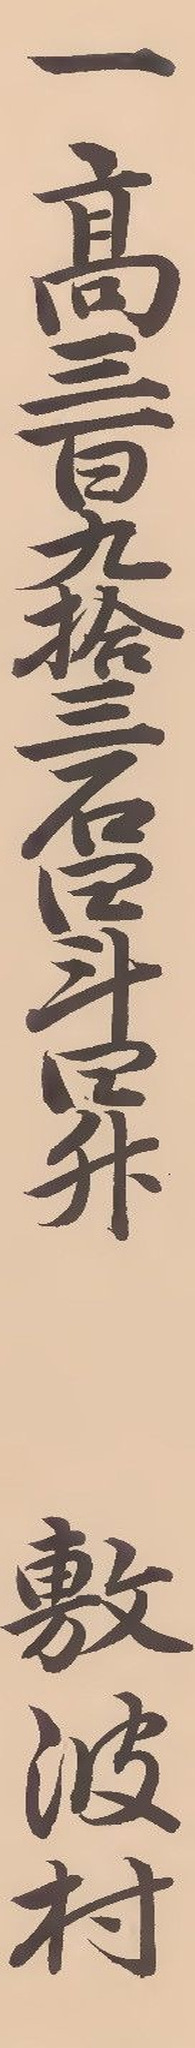一高三百九拾三石四斗四升敷波村
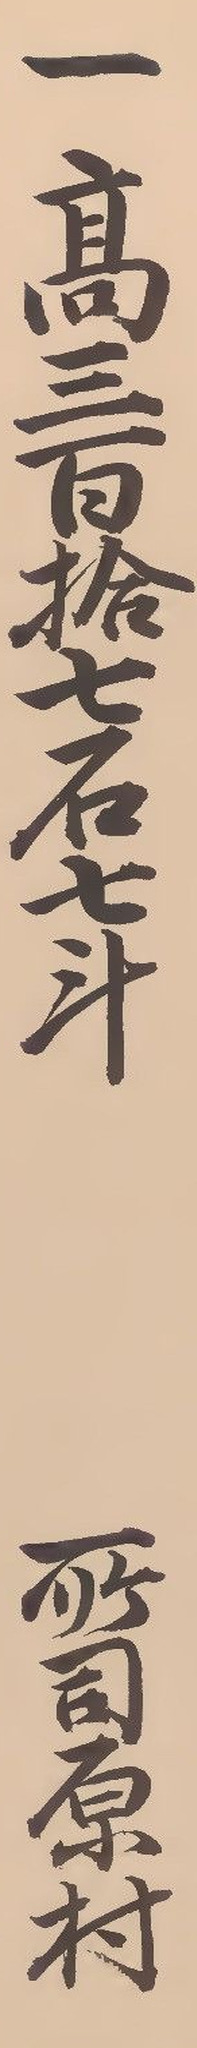一高三百拾七石七斗所司原村
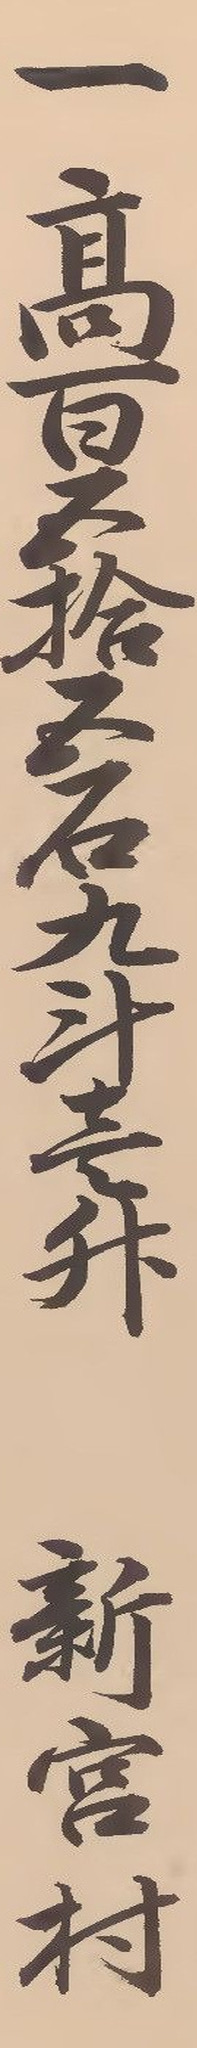一高百五拾五石九斗壱升新宮村
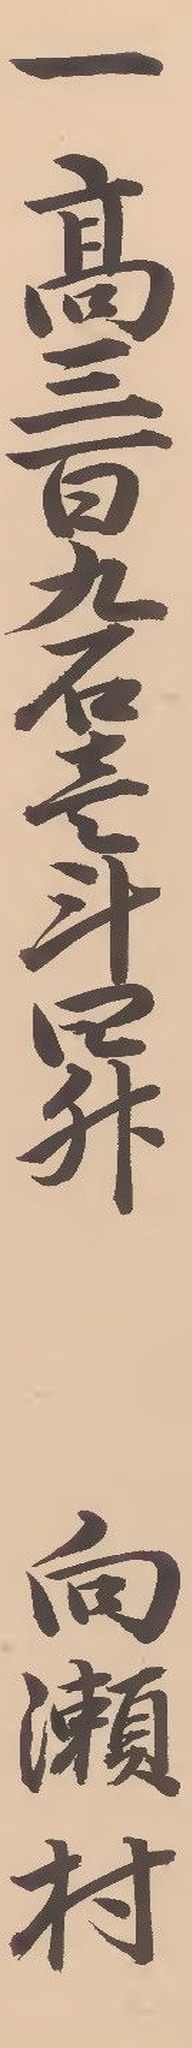一高三百九石壱斗四升向瀬村

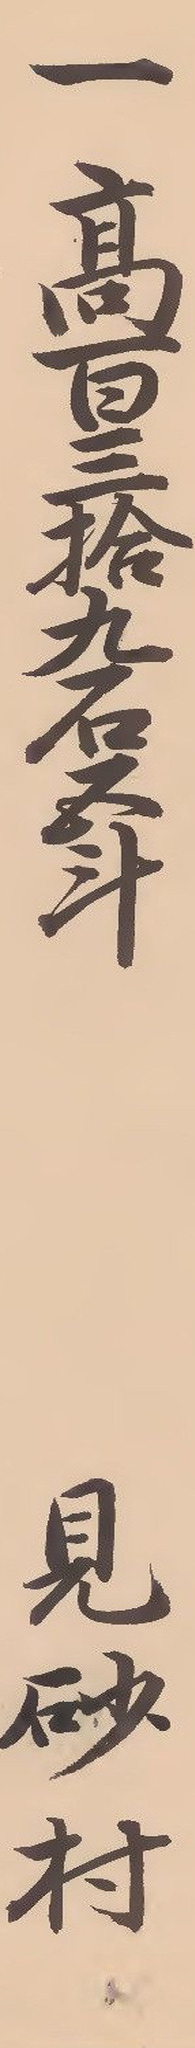一高百三拾九石五斗見砂村
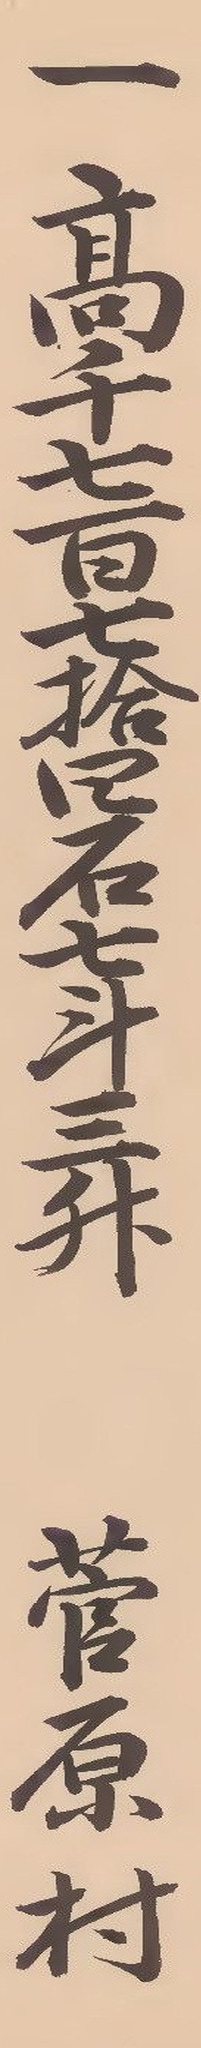一高千七百七拾四石七斗三升菅原村
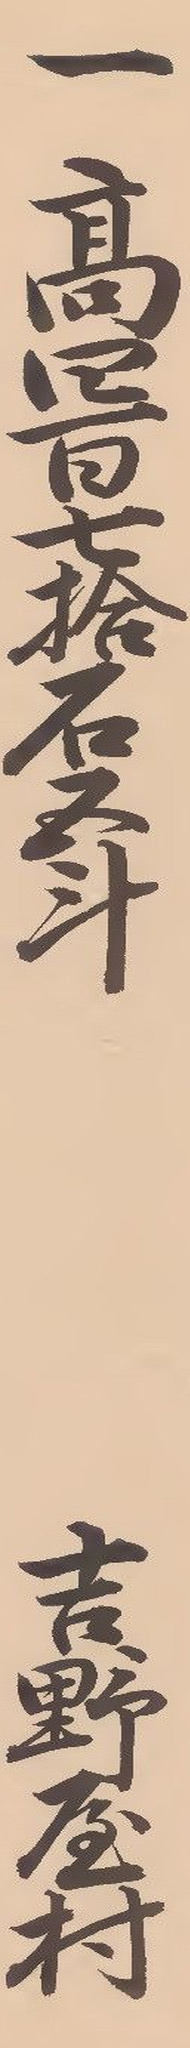一高四百七拾石五斗吉野屋村
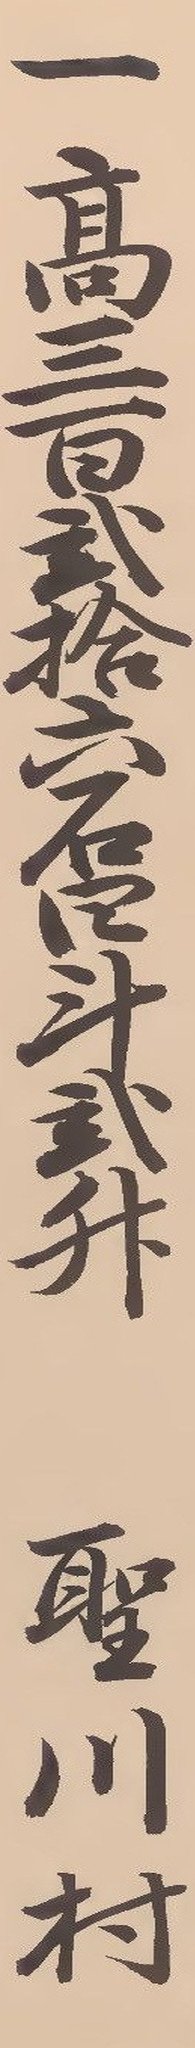一高三百弐拾六石四斗弐升聖川村
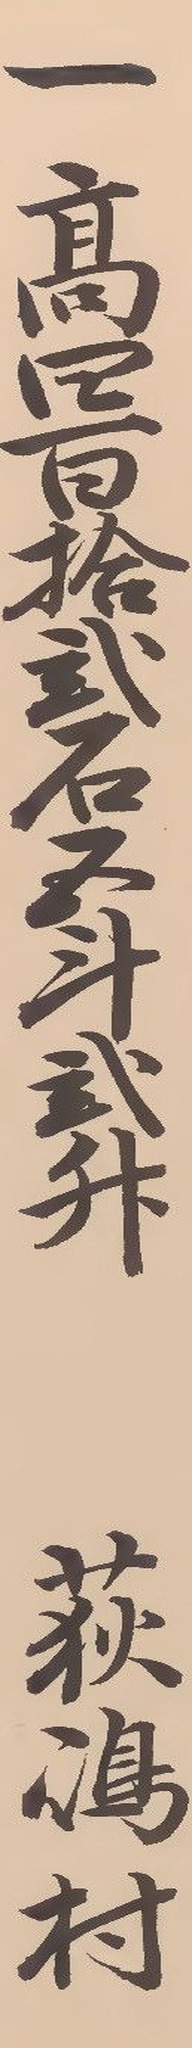一高四百拾弐石五斗弐升荻島村
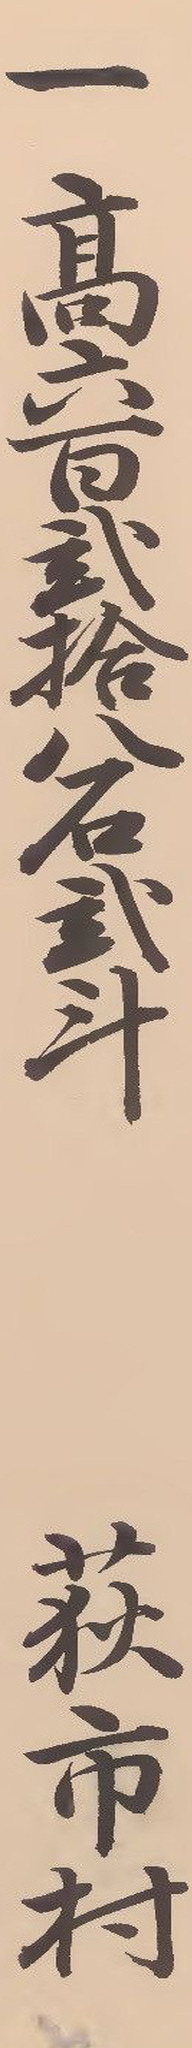一高六百弐拾八石弐斗荻市村
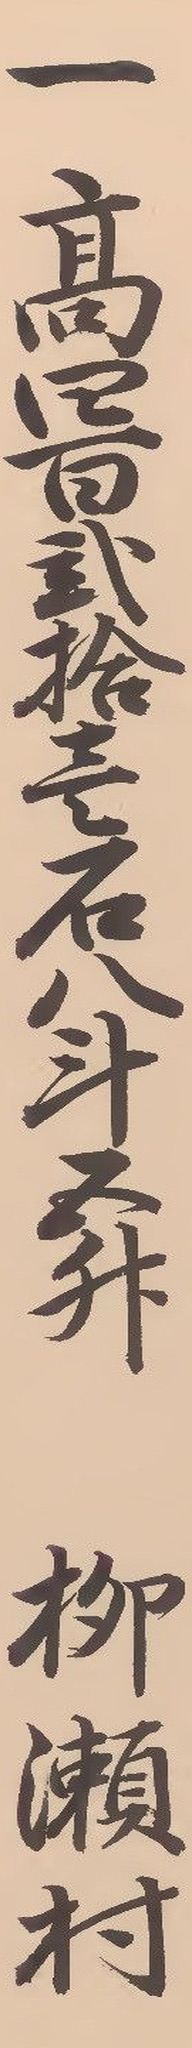一高四百弐拾壱石八斗五升柳瀬村

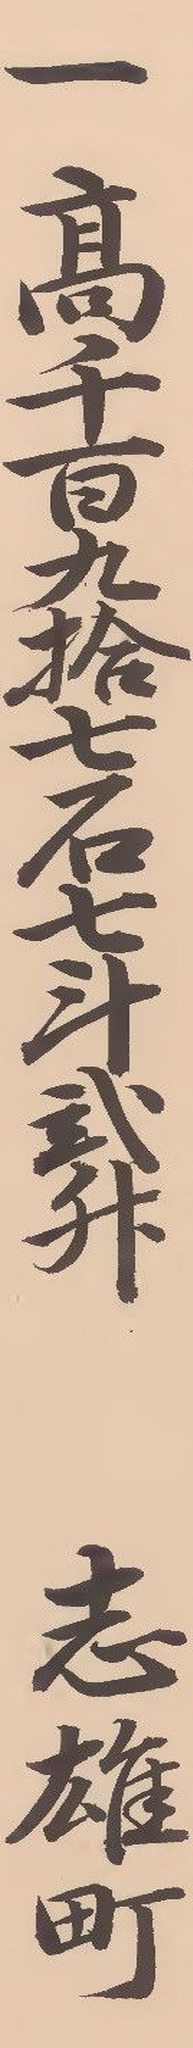一高千百九拾七石七斗弐升志雄町
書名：能登国郷帳
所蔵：国立公文書館 National Archives of Japan
